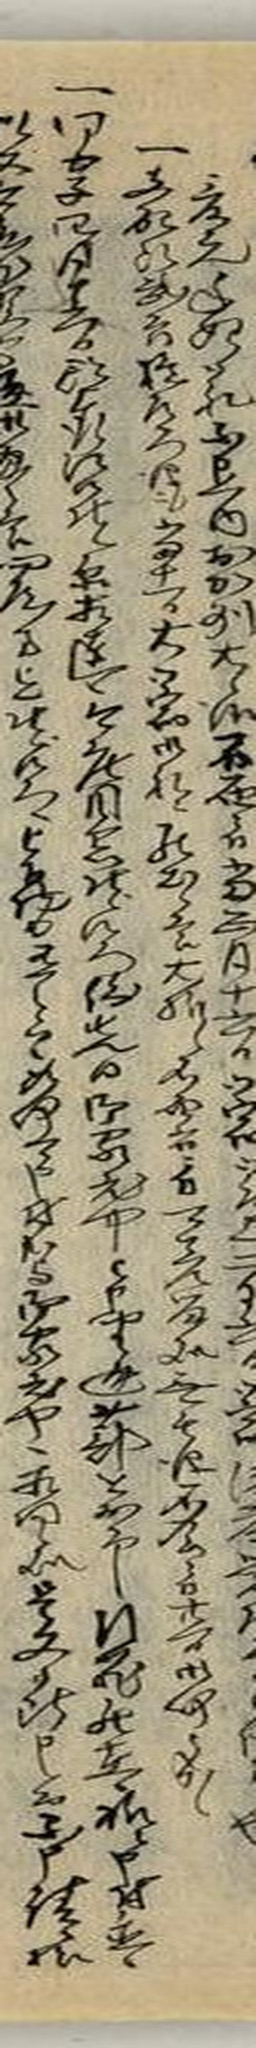猶又今度加賀守殿御通之節問屋方迄次郎左衛門へ被下物も有之候ハヽ如何可申付哉与御家老中へ相伺候処是又御断申候而不申請候様
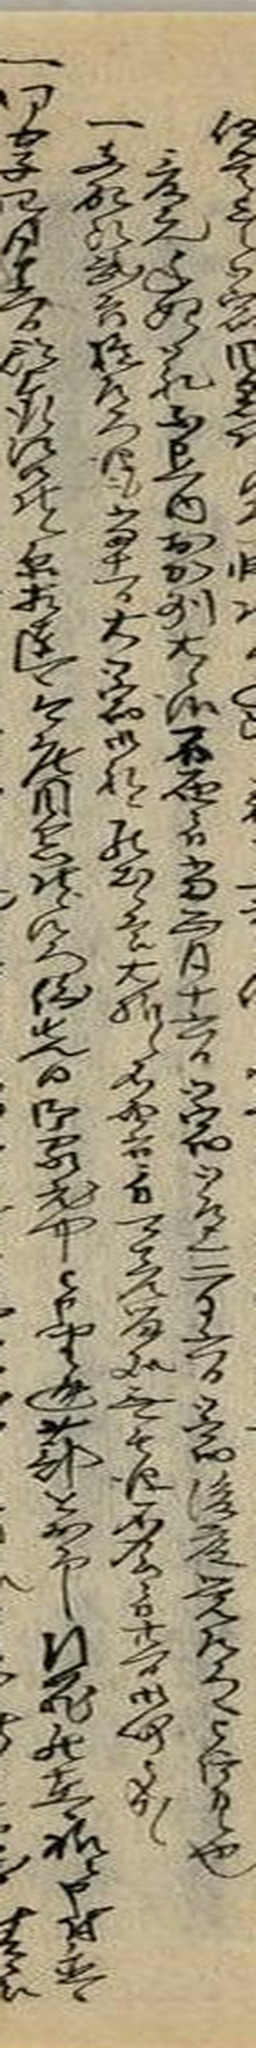一同五子四月十六日郡奉行江口次郎兵衛相達候今庄目黒次郎左衛門儀先日御家老中被申聞候通蔀をおろし引籠罷在候様ニ申付置候
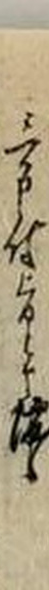ニ可申付旨被申渡候
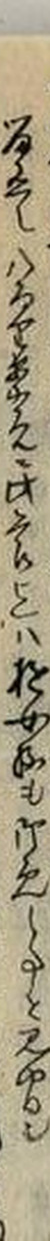留有之八百里案スルニ此節迄ハ遊女抔も御免之事と見ゆる也
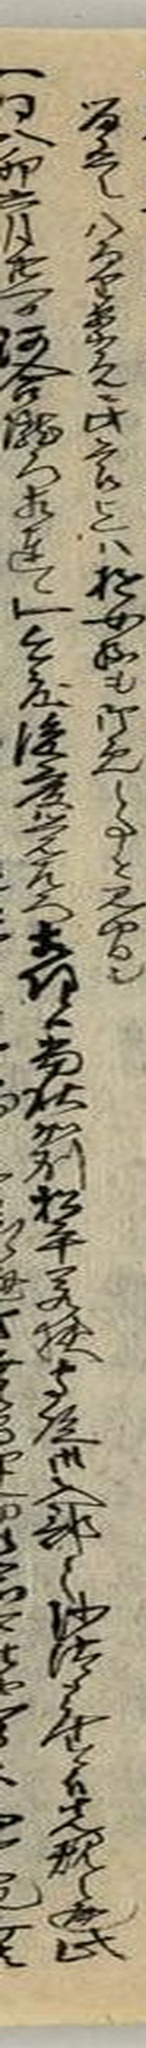一同八卯六月廿一日河合瀧右衛門相達候」今度後藤覚左衛門相伺候ハ当秋加州松平若狭守殿御入部之沙汰御座候ニ付先規之通此
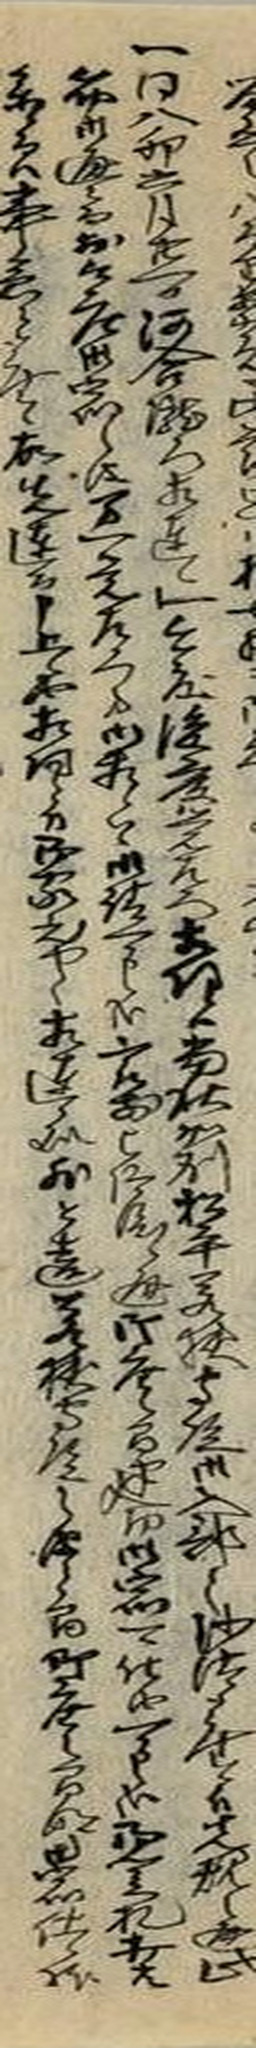参候而ハ事急ニ御座候故先達而申上候由相伺候ニ付御家老中へ相達候処外と違若狭守殿之儀候間御座之間明御宿仕候様
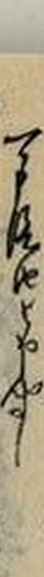可申渡由被申聞候
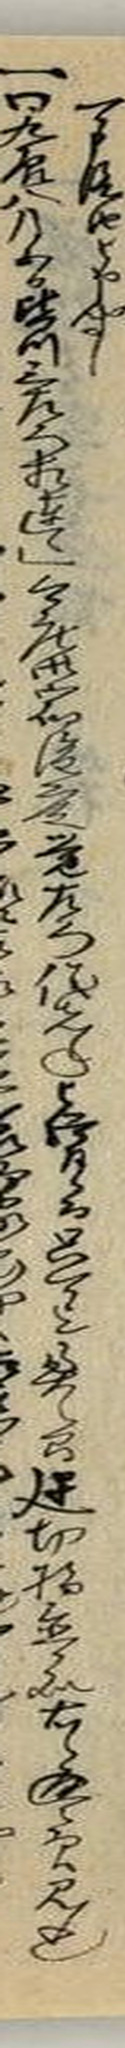一同九辰八月五日皆川三左衛門相達候」今庄御宿後藤覚左衛門儀先年被仰付候而只今迄奥之間建切指置候処右之通ニ而ハ見込
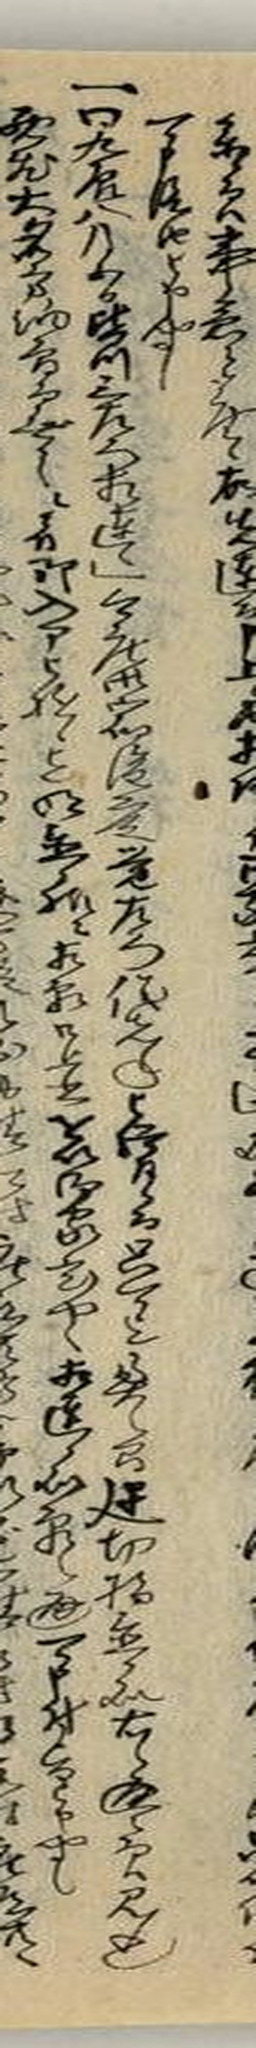悪敷大名方泊候間而無之候ニ付御入部被遊候迄明置候様ニ相願口上書を以御家老中へ相達候処願之通可申付旨被申聞候
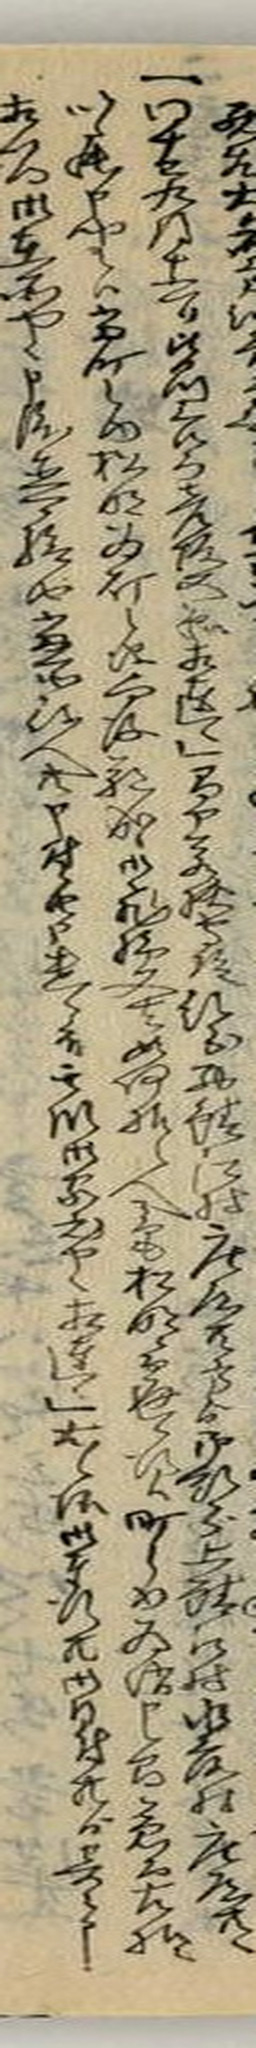相心得御在所中へ申渡置可給由当所役人共申付候由申遣候ニ付其段御家老中へ相達候」右之趣御奉行共御目付共ゟ呉々申
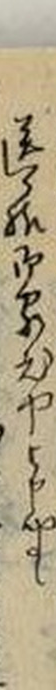達候様御家老中被申聞候
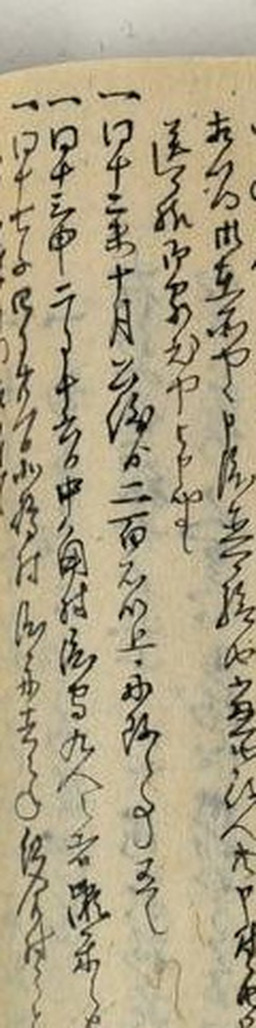一同十二未十月公儀ゟ二百石以上舟改候事有之
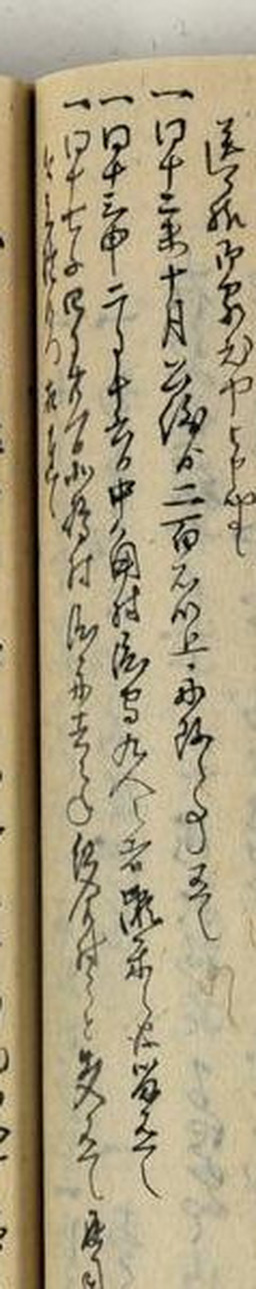一同十三申二月十六日中角村渡守九人之者瀬米之儀留有之
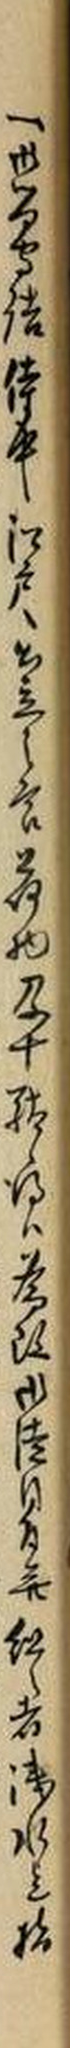一御留守詰侍中江戸へ出立之節荷物及十駄候得ハ為改御徒目付幷組之者浅水迄指
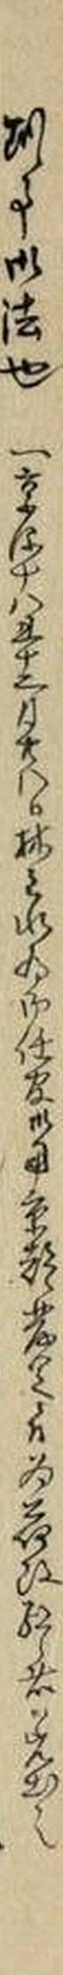越事御法也一享保十八丑十二月廿八日林主水為御任官御用京都へ発足ニ付為荷改組之者差出之
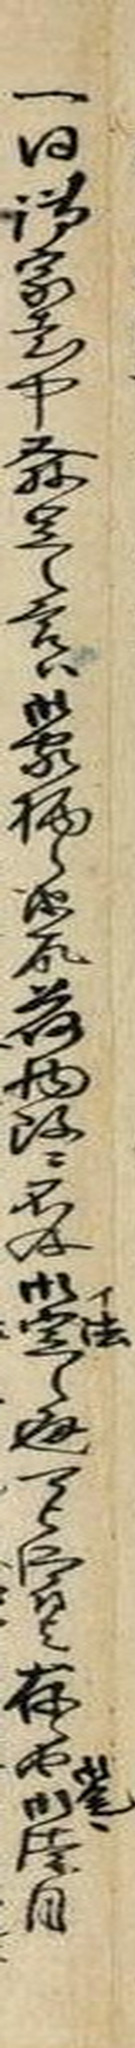一同御家老中発足之節ハ御家柄之儀故荷物改ニ不及御定之通可被仰付与存候由御宅へ御徒目
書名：御国他国諸事之部
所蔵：福井県文書館 Fukui Prefectural Archives
